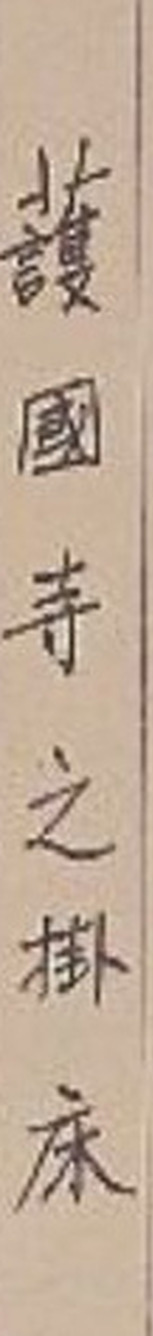護国寺之掛床
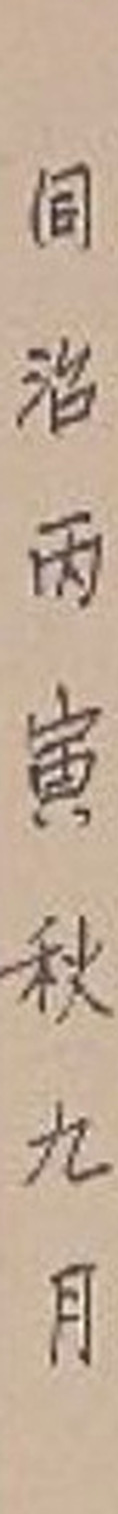同治丙寅秋九月
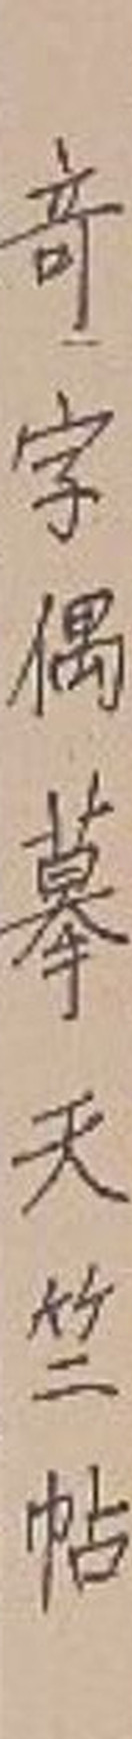奇字偶模天竺帖
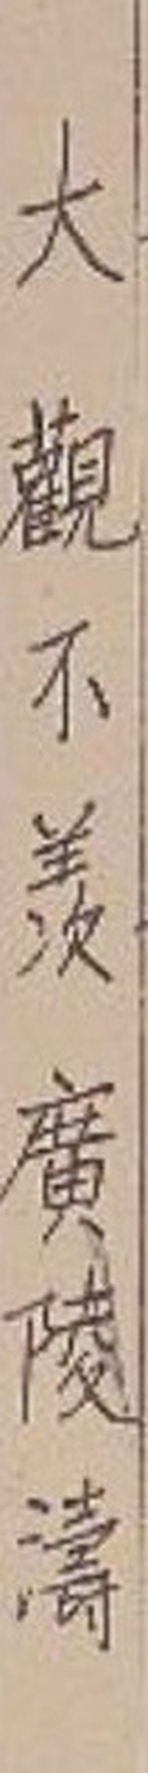大観不羨広陵濤
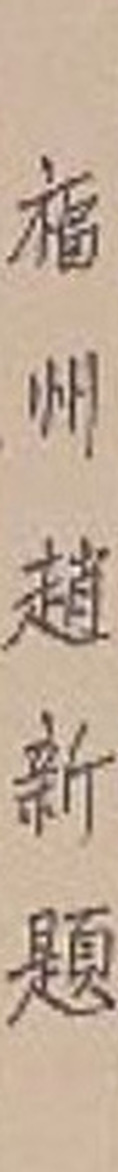福州趙新題
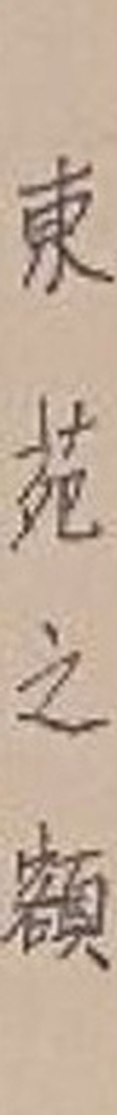東苑之額
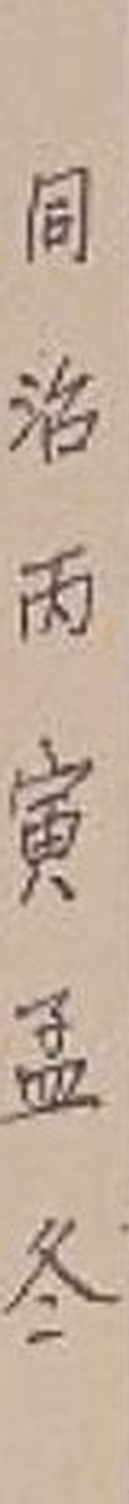同治丙寅孟冬
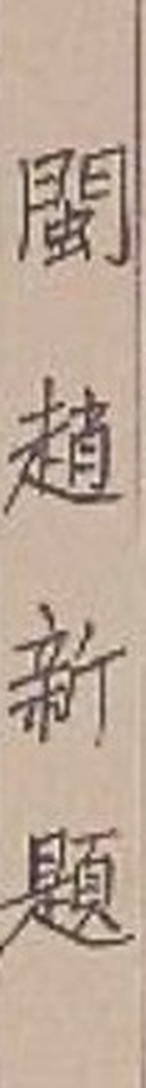閩趙新題
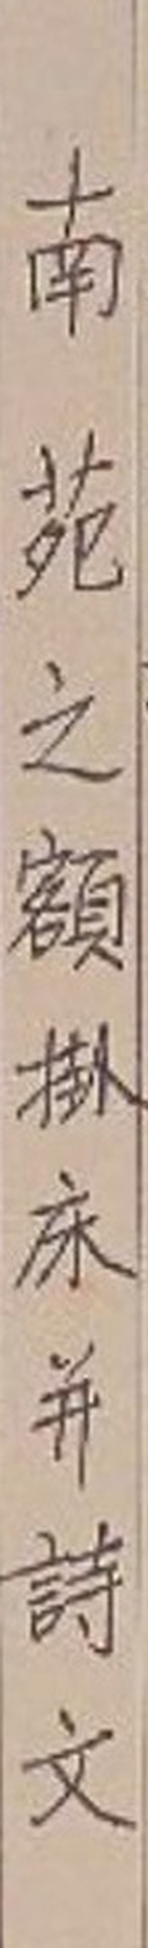南苑之額掛床并詩文

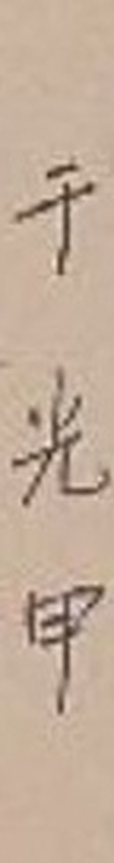干光甲
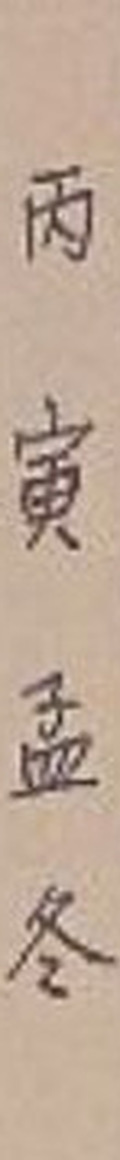丙寅孟冬
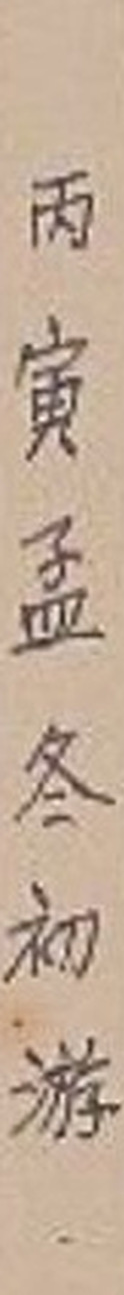間丙寅孟冬初游
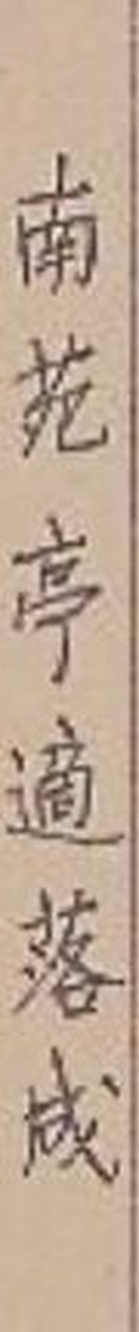想南苑亭適落成
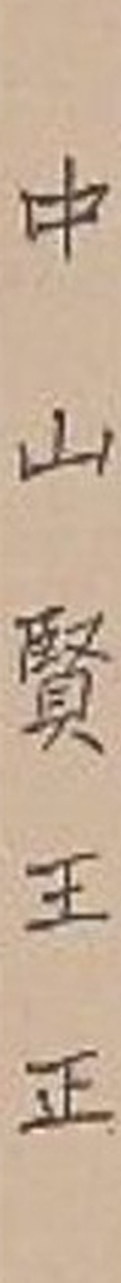中山賢王正
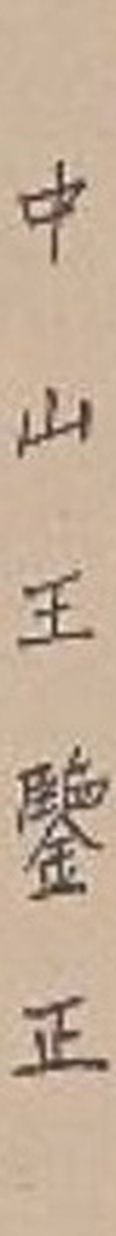中山賢王正
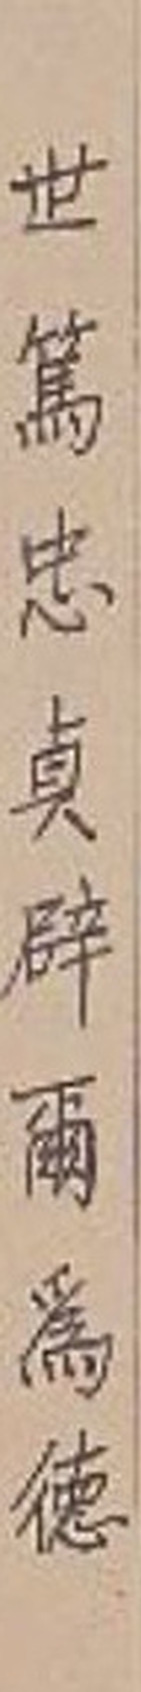皆世篤忠貞辟爾為徳
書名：支那冊封使来琉諸記 下巻
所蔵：University of the Ryukyus Library
